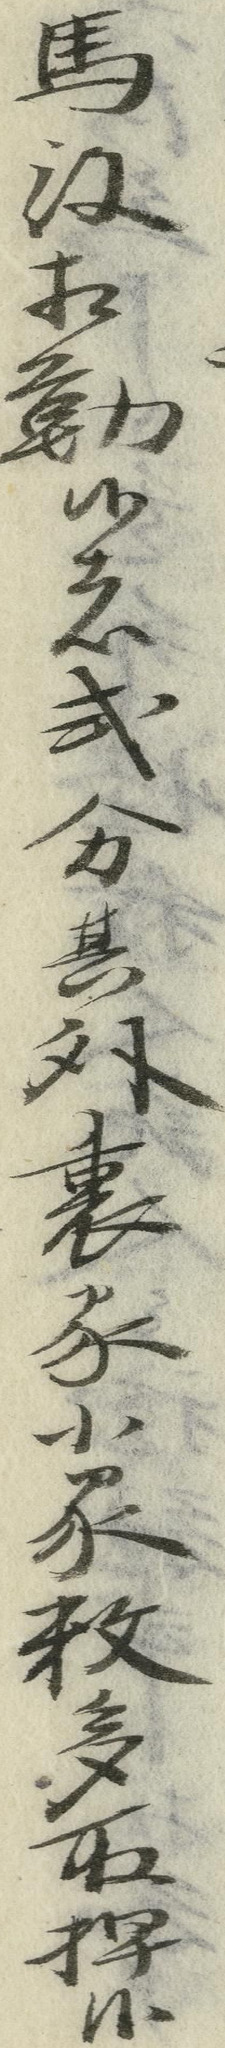馬役相勤候者弐分其外裏家小家数多取押候
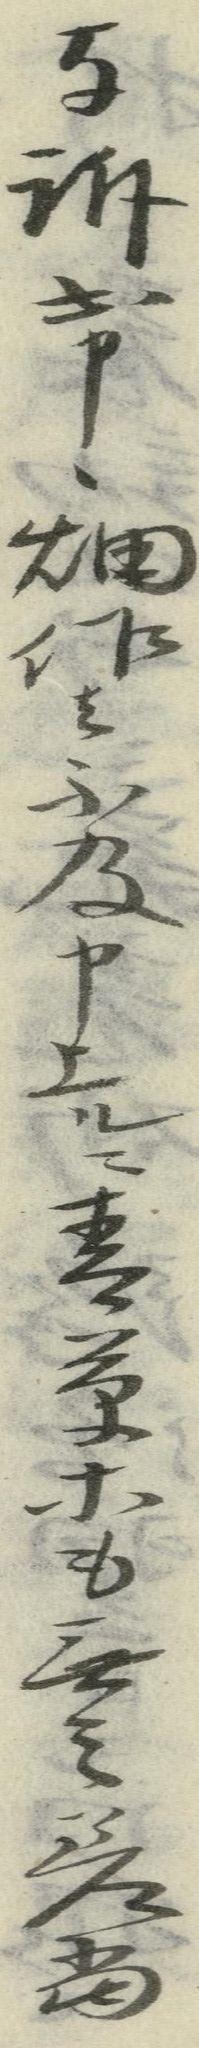と訴出申し候畑作は不及申上ルニ青草等も無之差当
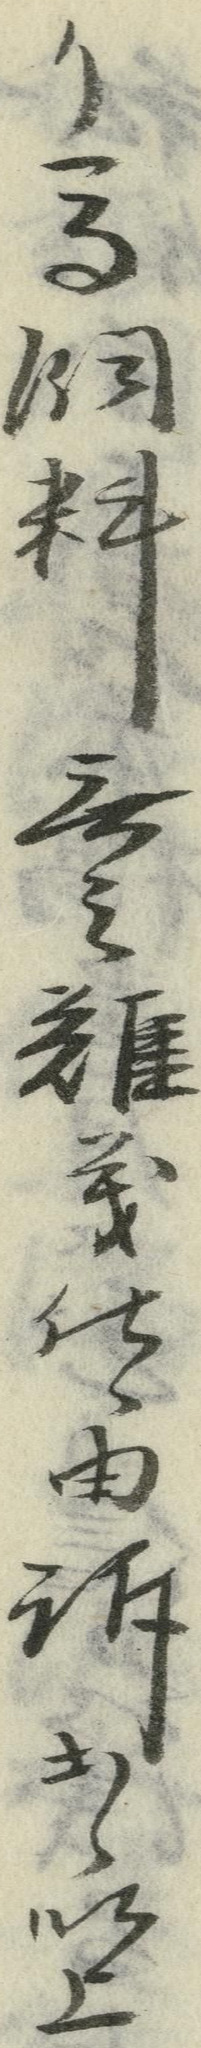リ馬飼料無之難義仕候由訴出候以上
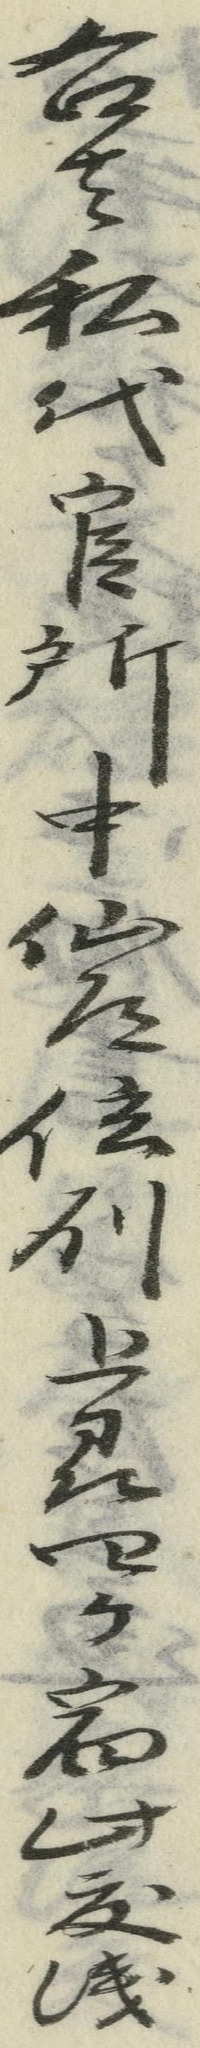右は私代官所中仙道信州上州四ケ宿此度浅
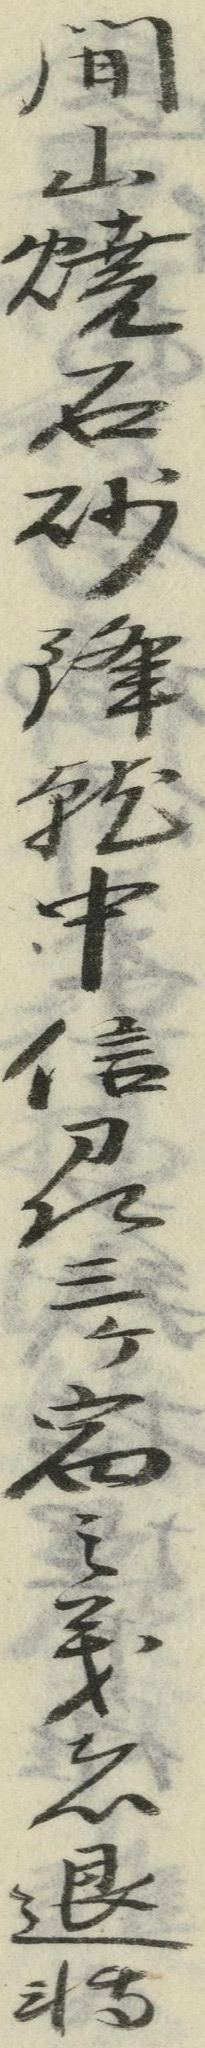間山焼石砂降就中信州三ケ宿之義者退転
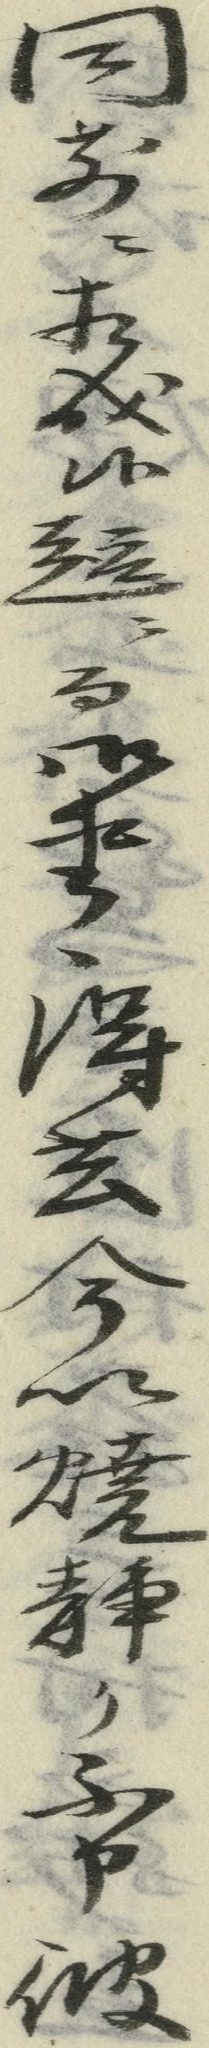同前ニ相成候趣ニ而御座候得共今以焼静リ不申彼
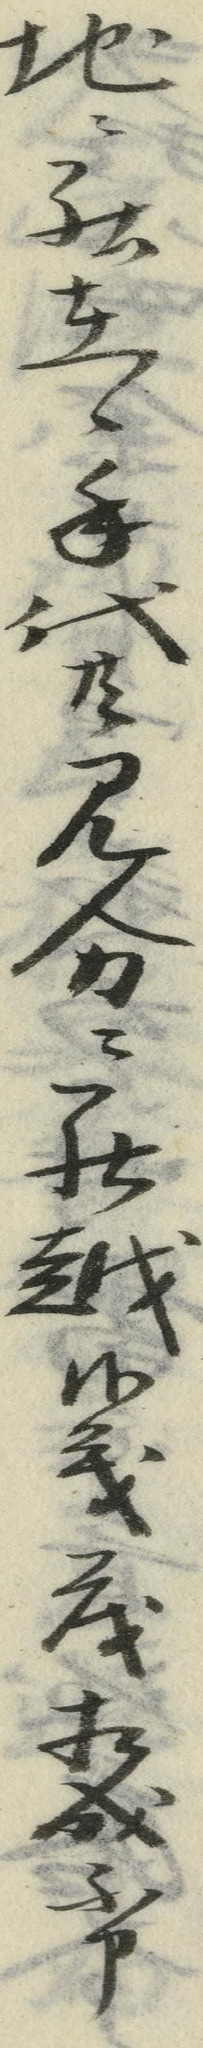地ニ罷在候手代共見分ニ罷越候義茂相成不申
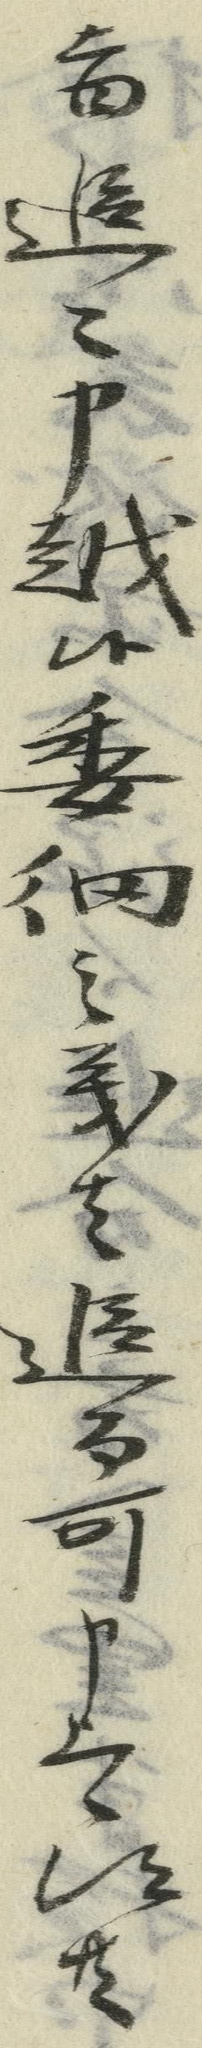旨追々申越候委細之義は追而可申上候得共
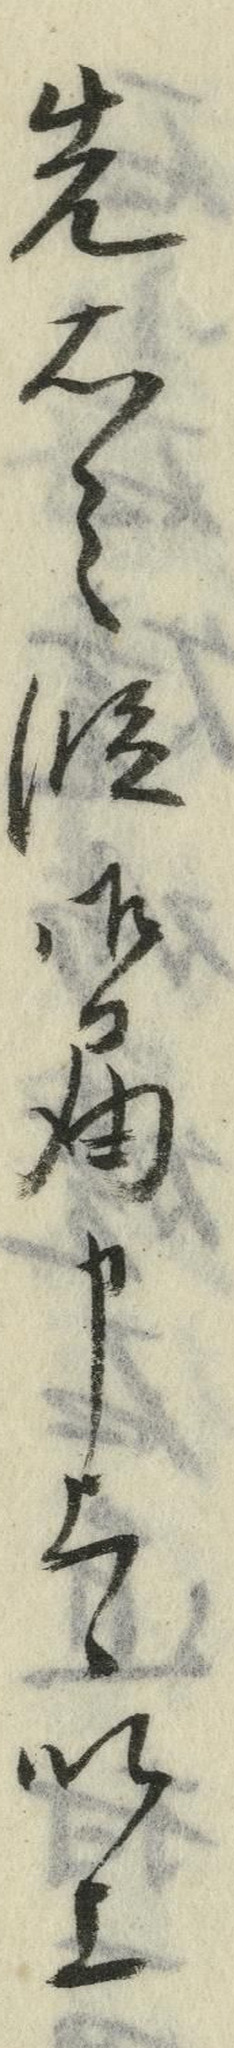先右之段御届申上候以上
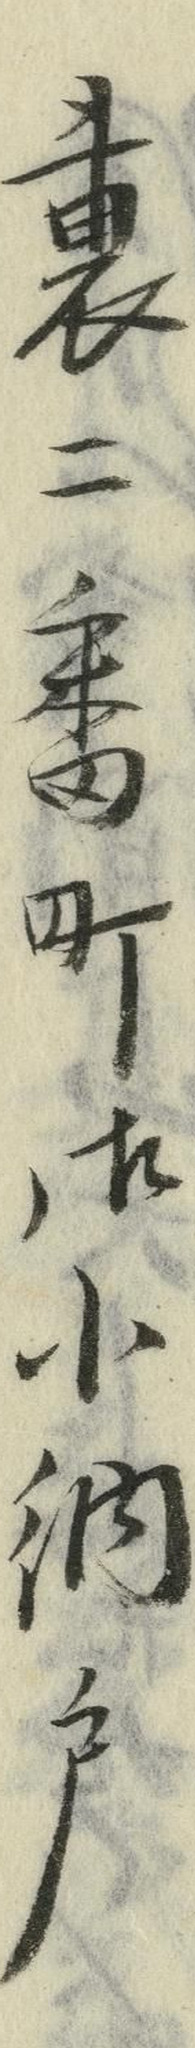裏ニ番町御小納戸
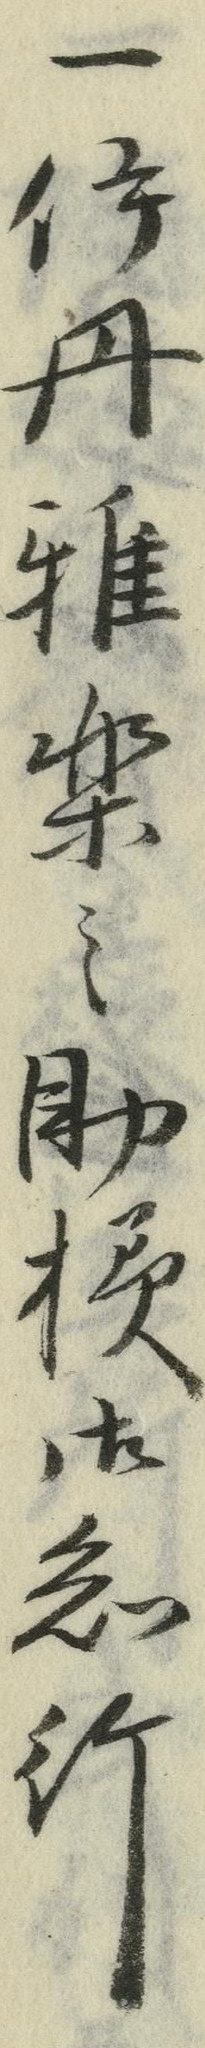一伊丹雅楽之助様御知行

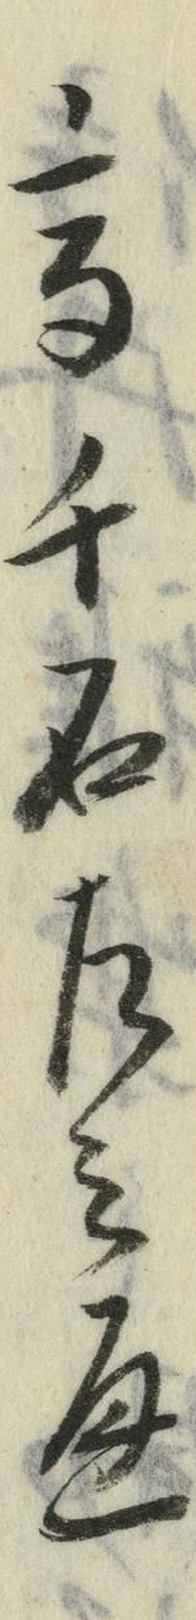高千石左之通
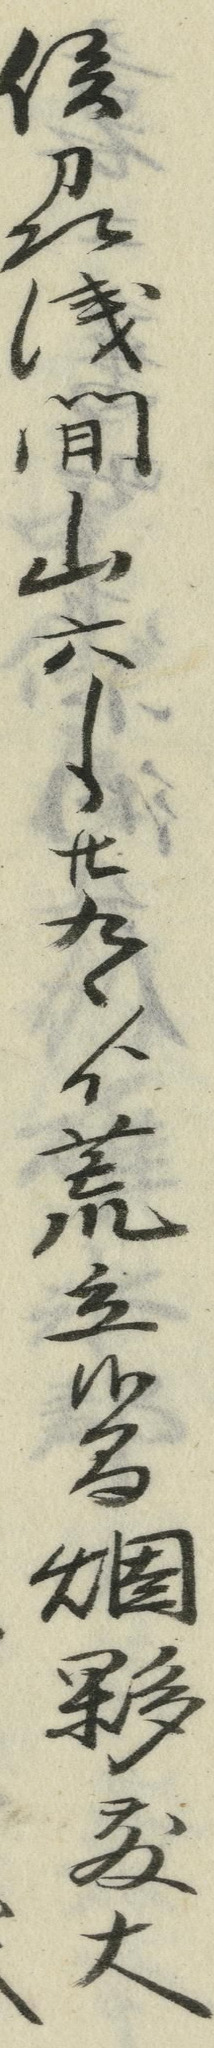信州浅間山六月廿九日ゟ荒立候間烟夥敷大
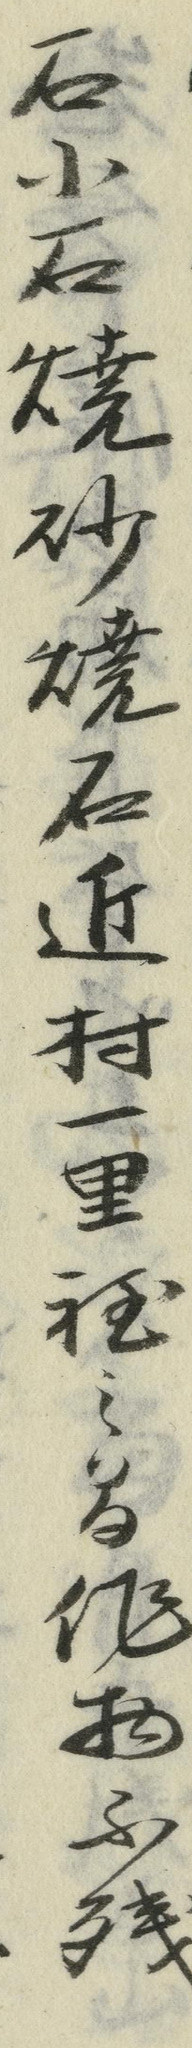石小石焼砂焼石付近一里程之間作物不残
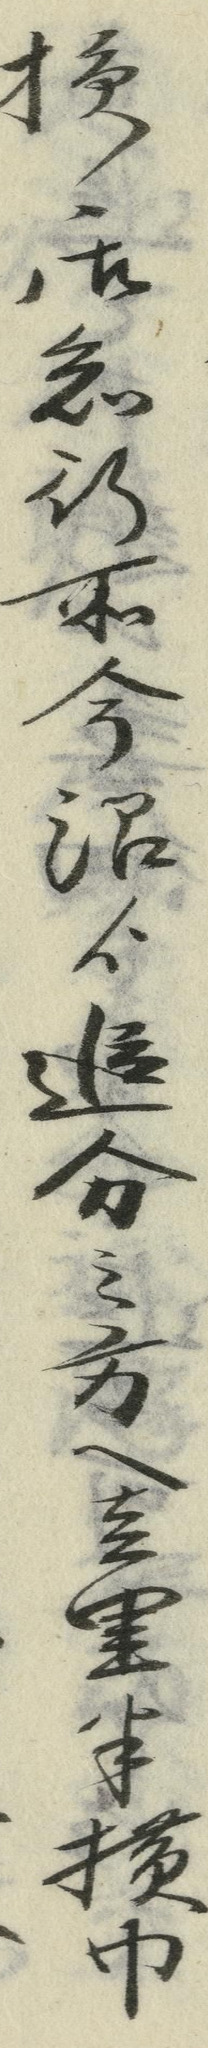損候御知行所今沼ゟ追分之方へ壱里半横巾
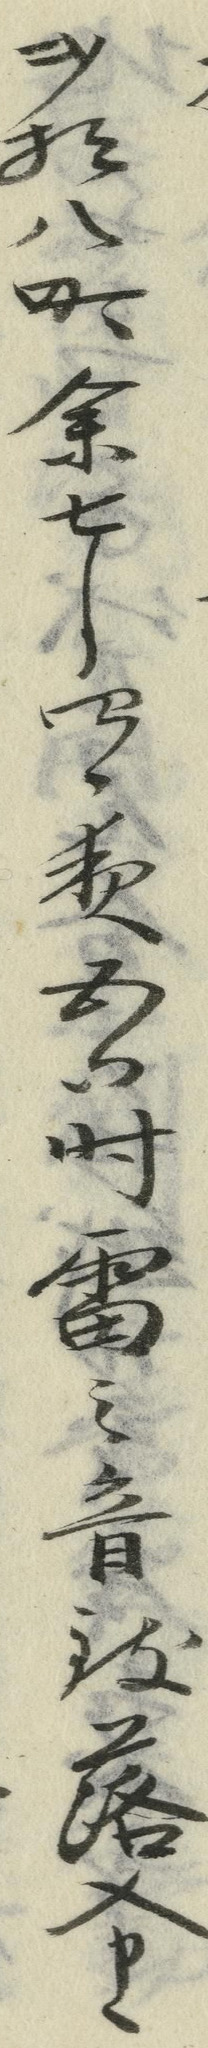弐拾八町余七月四日夜五ツ時雷之音致落入申候
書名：天明三癸卯七月信州浅間山焼出シ上州山津浪ニ付近國ヨリ御届書并訴書写
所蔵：東京大学地震研究所図書室 Earthquake Research Institute Library, The University of Tokyo, JAPAN
